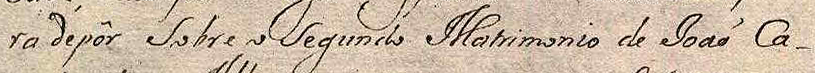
ra depôr sobre o segundo Matrimonio de Ioaõ Ca
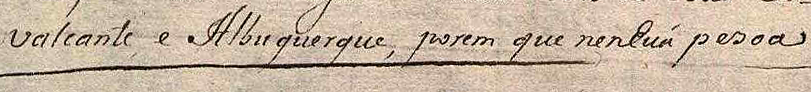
valcante, e Albuquerque, porem que nenhuā pesoa
